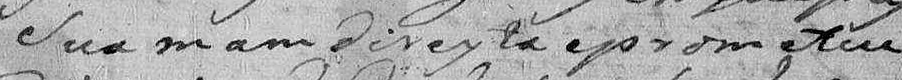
Sua mam direyta e prometeu
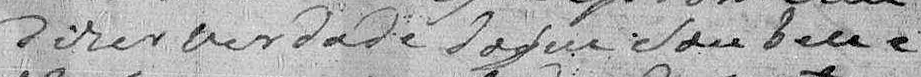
dizer verdade do que soubece e
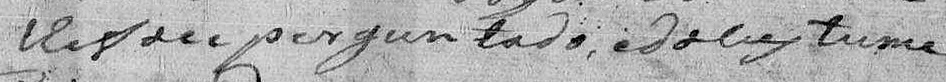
lhe foce perguntado, e do custume
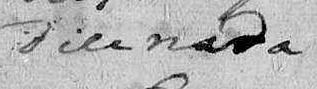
dice nada
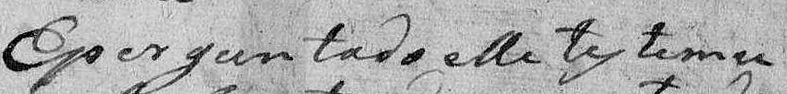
E perguntado elle testemu
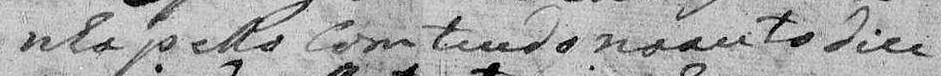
nha pello Comteudo no auto dice
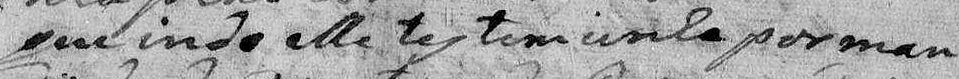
que indo elle testemunha por man
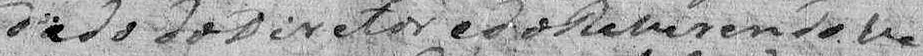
dado do Diretor e do Reverendo ve
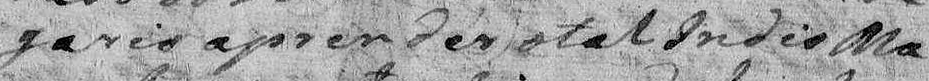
gario aprender o tal Indio Ma
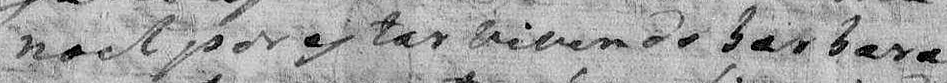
noel por estar vivendo barbara
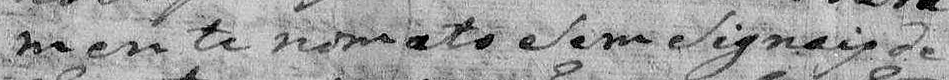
mente no mato sem signais de
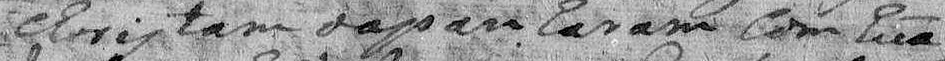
christam o apanharam com huā
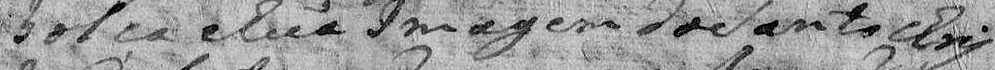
bolça e huā Imagem do Santo chris
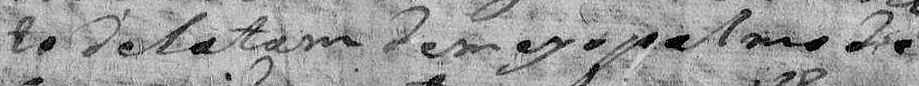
to de latam de meyo palmo de
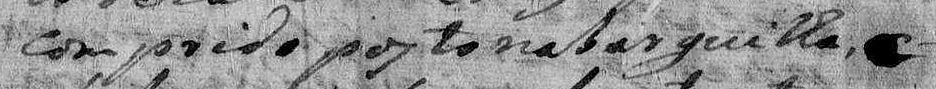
comprido posto na barguilha, e
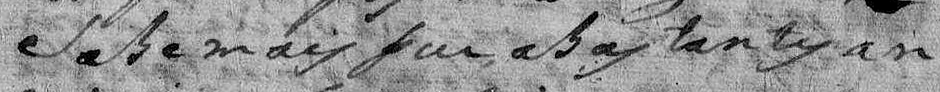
sabe mais que abastantes an
